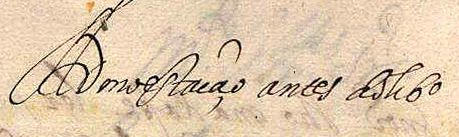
Admoestação antes do libo
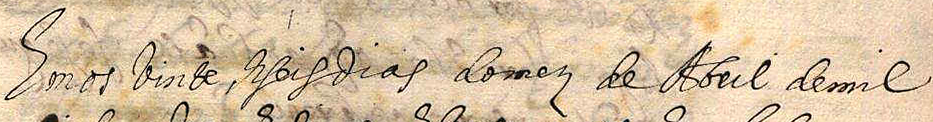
Em os vinte, E seis dias do mez de Abril de mil
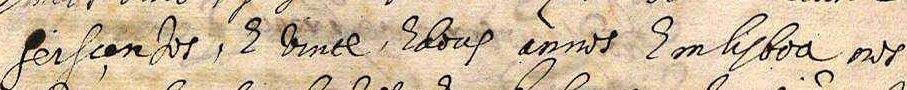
seisçentos, E vinte, E dous annos Em lisboa nos
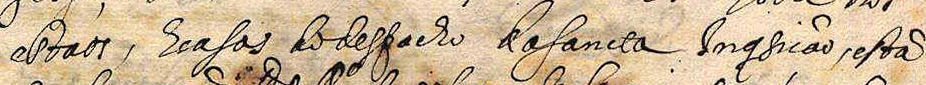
estaos, E casas do despacho da sancta Inq̄siçaõ, estā
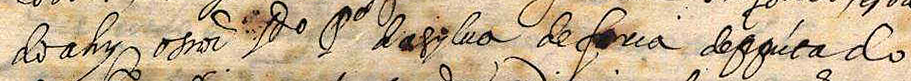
do ahy o snor̄ ldo Po da sylua de faria depputado
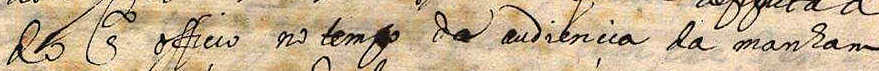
do sto offiçio no tempo da audiençia da manham
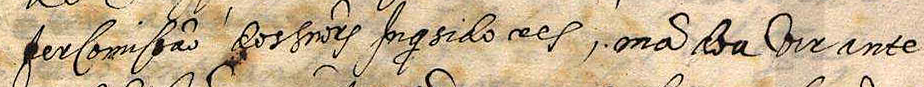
per Comissão dos snor̄s Jnq̄sidores, mādou vir ante
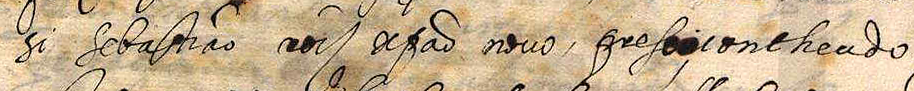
si sebastião roīz xpão nouo, preso_ contheudo
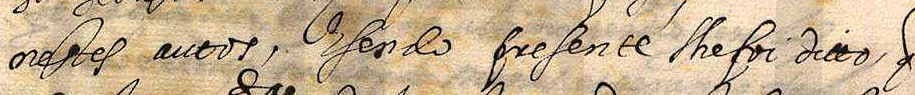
nestes autos, E sendo presente lhe foi ditto, q̄
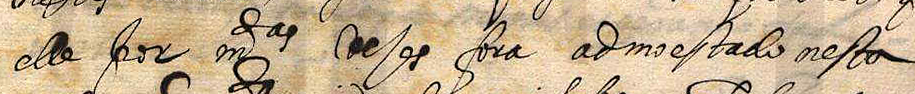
elle por mtas vezes fora admoestado nesta
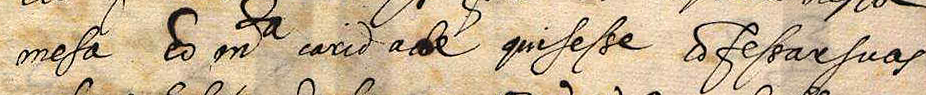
mesa cō mta caridade quisesse cōfessar suas
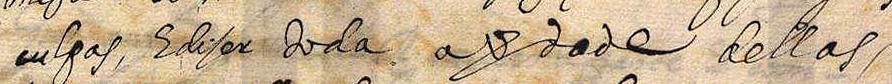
culpas, E dizer toda a ꝟdade dellas,
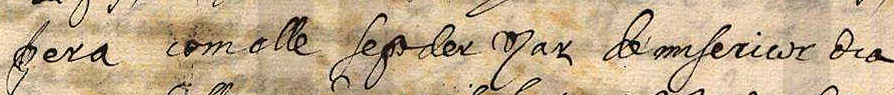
pera com elle se poder vzar de misericordia,
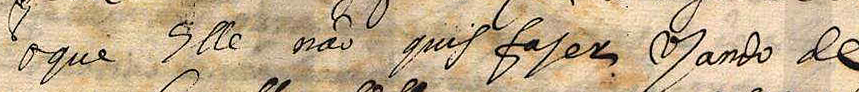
o que Elle não quis fazer vzando de
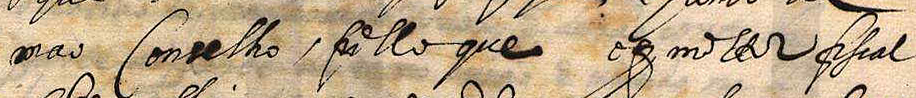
mao Conselho, pello que o ꝓmottor fiscal
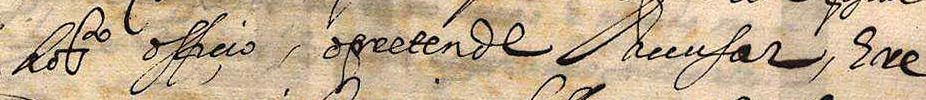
do sto offiçio, o pretende accusar, E re
